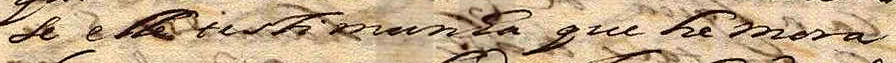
se elle testimunha que he mora
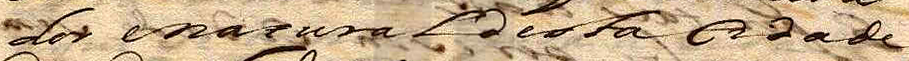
dor e naturaL desta Cidade
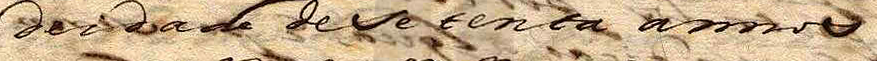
de idade de setenta annos
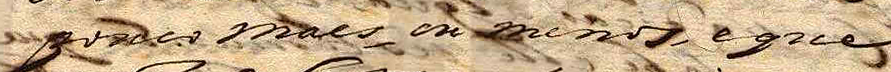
pouco maes, ou menos, e que
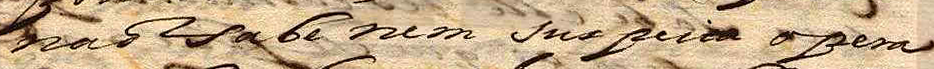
naõ sabe nem suspeita o pera
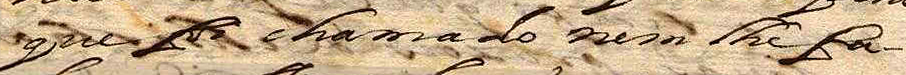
que foi chamado nem lhe fa
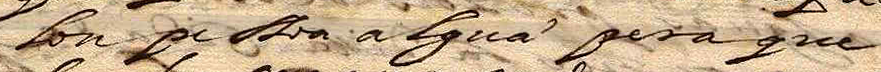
lou pessoa alguā pera que
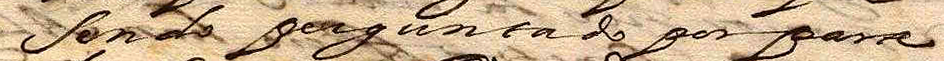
Sendo perguntado por parte
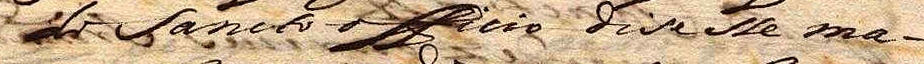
do Sancto officio disesse ma
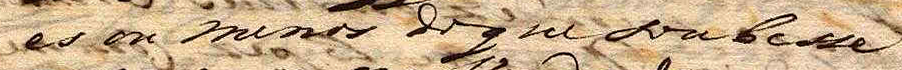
es ou menos do que soubesse
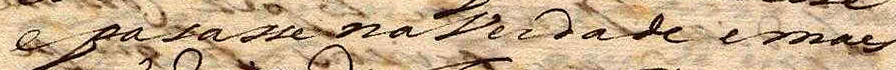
e pasasse na Verdade e maes
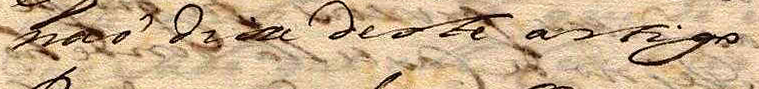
naõ disse deste artigo
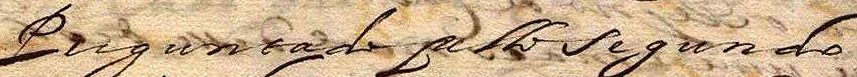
Perguntado pello segundo
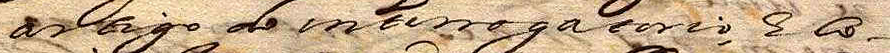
artigo do interrogatorio, E co
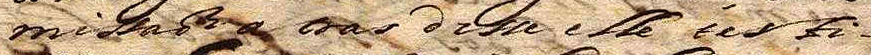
missaõ atras disse elle testi
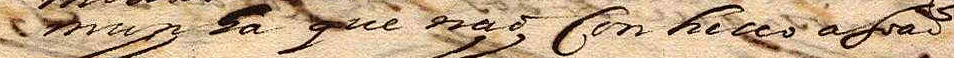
munha que naõ Conheceo a João
